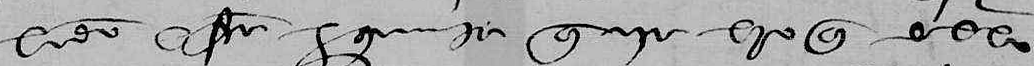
lido e fc̄a ꝑgunta q̄ era ho q̄ dello
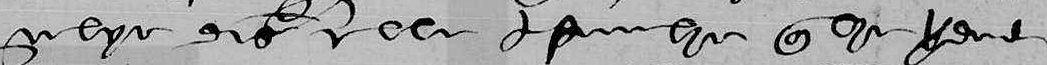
sabya dise elle testemunha q̄ he ꝟdade
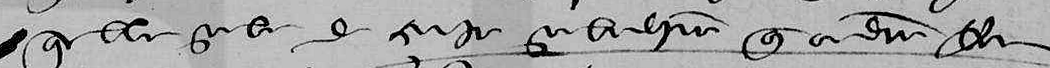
q̄ elle sabe de certa sabedoria q̄ a dīa Ree
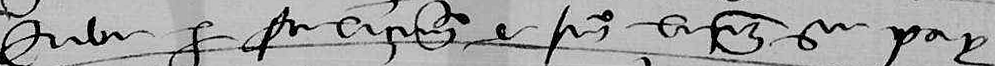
Erdou ꝑ falecimto de Jmo lopez seu pay
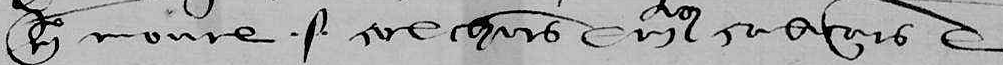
mto mouel .s. colchões e mtꝯ cabeçais e
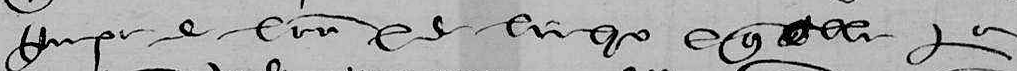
Roupa de lāa e de linho e q̄ Elle ta
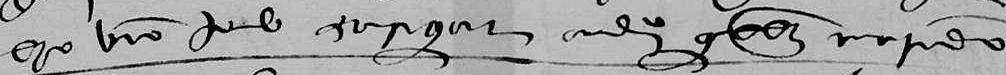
ho vio todo caregar a djo gl̄lz marido
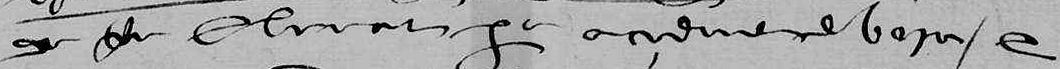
da Ree e leuar ꝑa a cidade devora / e
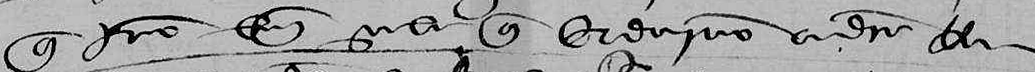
q̄ tãobem sabe q̄ Erdarão a dīa Ree
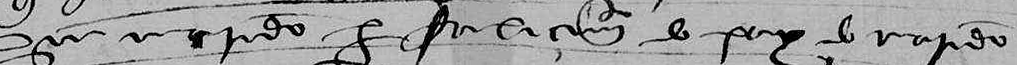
e seu marido ꝑ falecimto do pay do marido
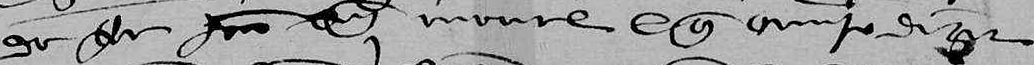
da Ree tãobem mouel e q̄ ouujo dizer
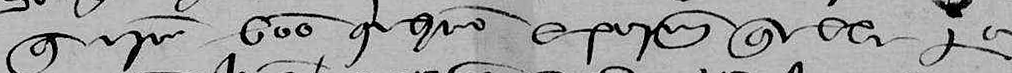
q̄ erā bōo qinhão e porem q̄ elle ta
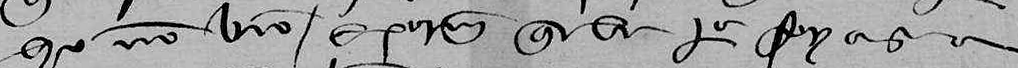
ho n̄o vio / e porem q̄ ele ta foy a sua
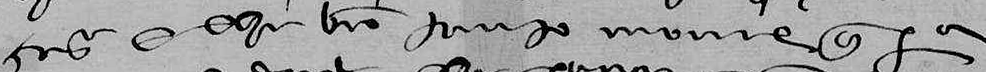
casa e lhe vio tanto mouel q̄ ꝑa
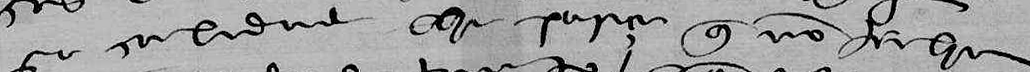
sua calidade lhe parece q̄ n̄o tinha
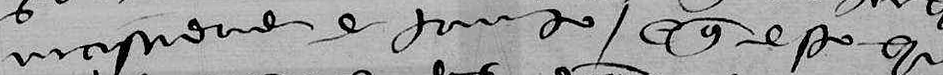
necesidade de tanto / e q̄ desto he
